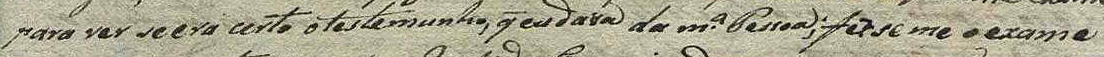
para ver se era certo o testemunho, q̄ eu dava da m.a Pessoa; fezse me o exame
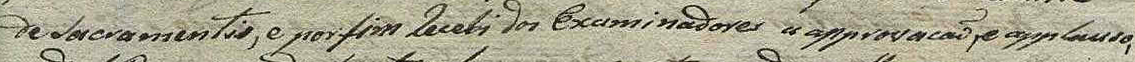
de sacramentis, e por fim Recebi dos Examinadores a approvaçaõ, e applauso,
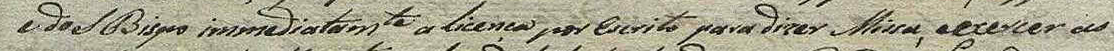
e do S. Bispo immediatam.te a licença por escrito para dizer Missa, e exercer as
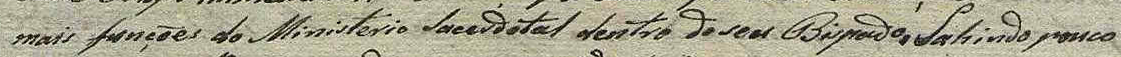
mais funções do Ministerio Sacerdotal dentro de seus Bispados Sahindo pouco
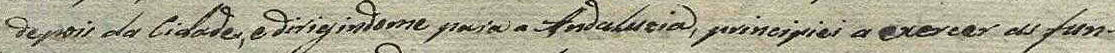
depois da Cidade, e dirigindome para a Anduluzia, principiei a exercer as fun
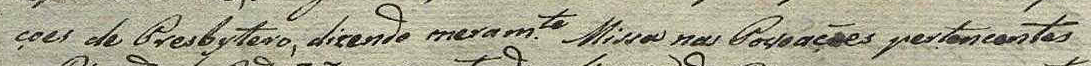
çoes de Presbytero, dizendo meram.te Missa nas Povoações pertencentes
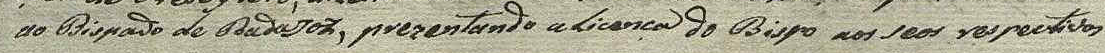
ao Bispado de Badajoz, prezentando a Licença do Bispo aos seos respectivos
